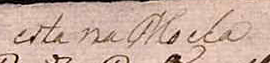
esta na Mocha
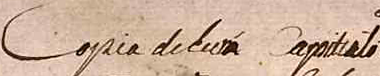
Copia de hum Capitulo
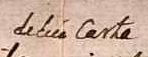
de hūa carta
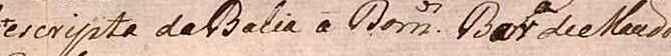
escripta da Bahia à Dom.os Bara de Macedo
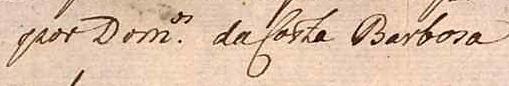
por Dom.os da Costa Barbosa
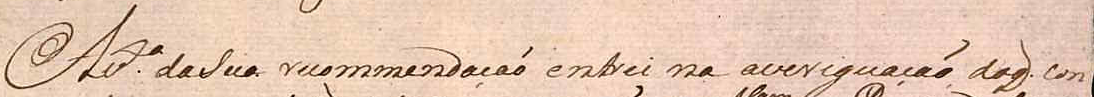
A v.ta da sua recommendaçaõ entrei na averiguaçaõ do q̄ con
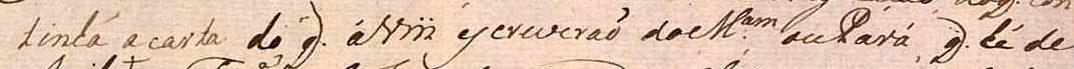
tinha a carta do q̄ á Vm̄ escreveraõ do M.am ou Pará, q̄ hé de
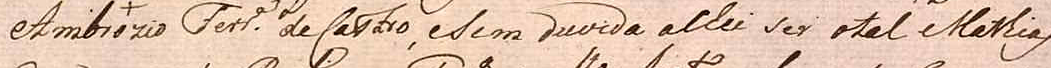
Ambrozio Ferr.a de Castro, e sem duvida achei ser o tal Mathias
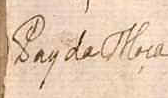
Pay da Moça
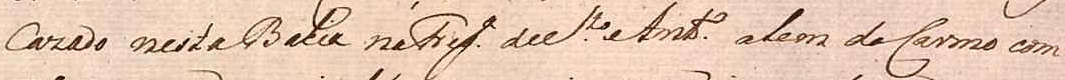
cazado nesta Bahia na Freg.a de S.to Ant.o alem do Carmo com
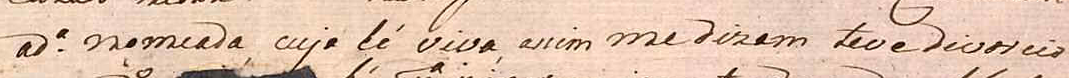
a d.a nomeada cuja hé viva, assim me dizem teve divorcio
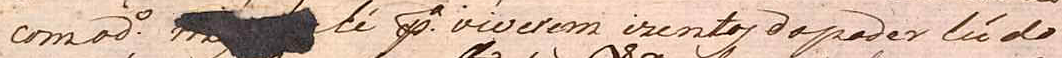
com o d.o _ hé p.a viverem izentos do poder hū do
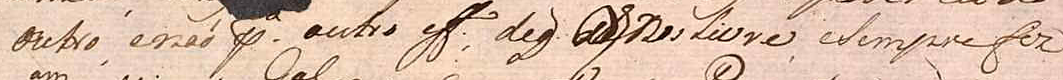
outro, e naõ p.a outro eff.o de q̄ Ds̄ nos livre, e sempre fez
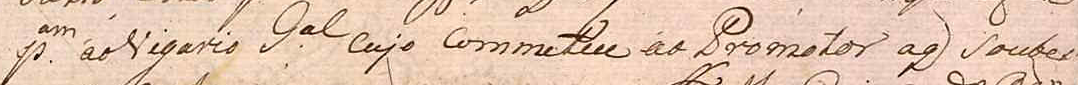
p.am áo Vigario G.al cujo commeteu áo Promotor a q̄ soubes
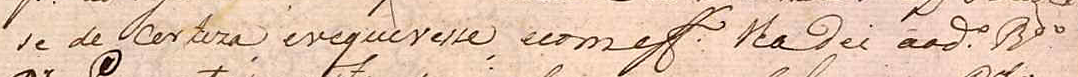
se de certeza e requeresse e com eff.o lha dei ao d.o Rdo
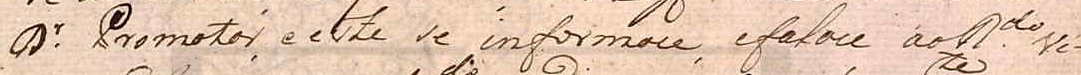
D.r Promotor, e este se informou, e falou ao R.do Vi
